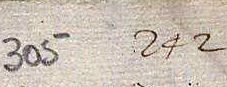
242
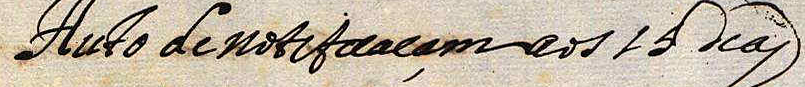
Auto de notifiaçam aos 15 dias
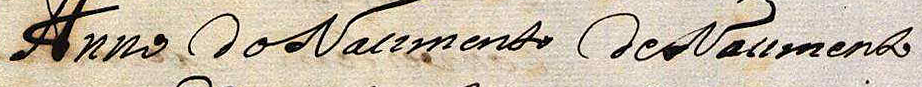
Anno do Nacimento de Nacimento
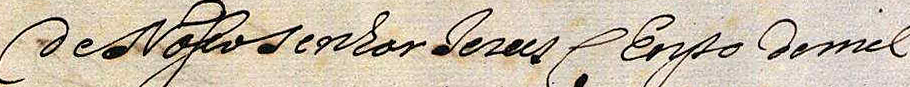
de Nosso senhor Iezus Christo de mil
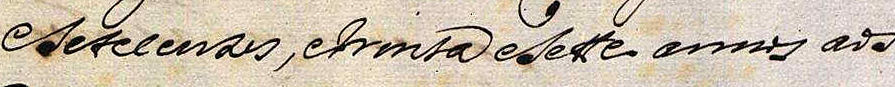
e setecentos, e trinta e sette annos aos
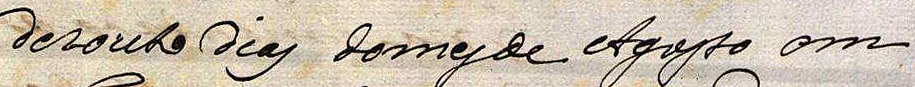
dezouto dias do mes de Agosto em
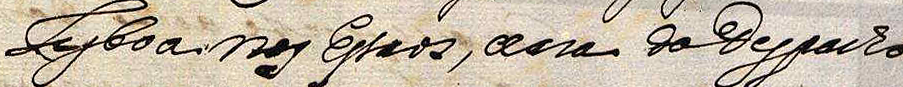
Lisboa nos Estaos, e caza do Despacho
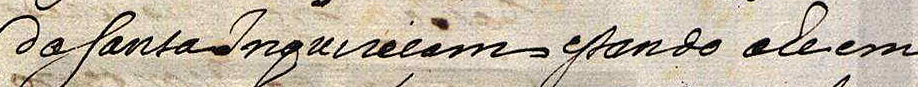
da santa Inquiziçam estando ahi em
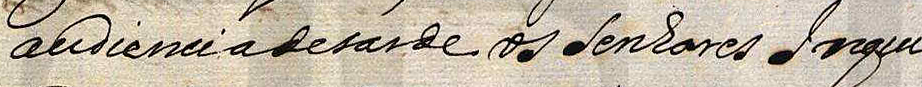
audiencia de tarde os senhores Inqui
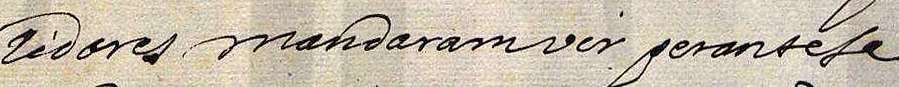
zidores mandaram vir perante si
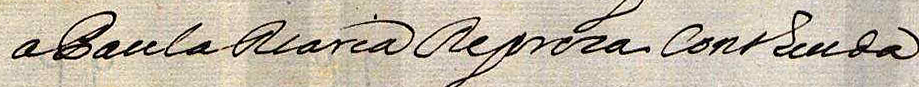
a Paula Maria Re preza contheuda
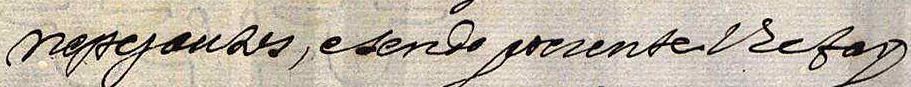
nestes autos, e sendo prezente lhe foy
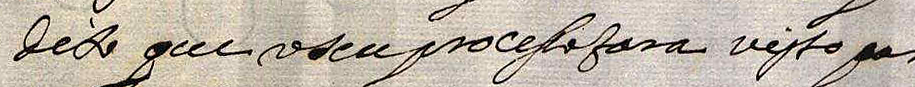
dito que o seu processo fora visto por
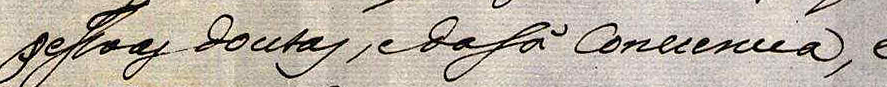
pessoas doutas, e da sã conciencia, e
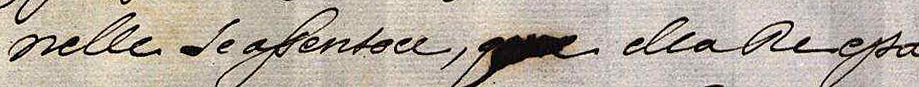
nelle se assentou, que ella Re esta
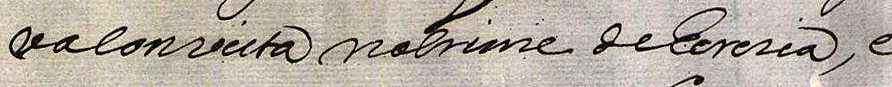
va convicta no crime de herezia, e
